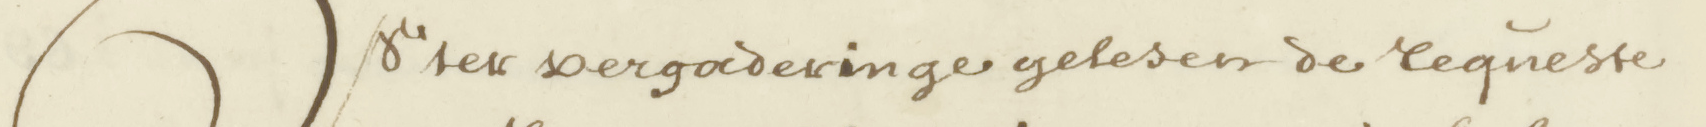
Is ter vergaderinge gelesen de requeste
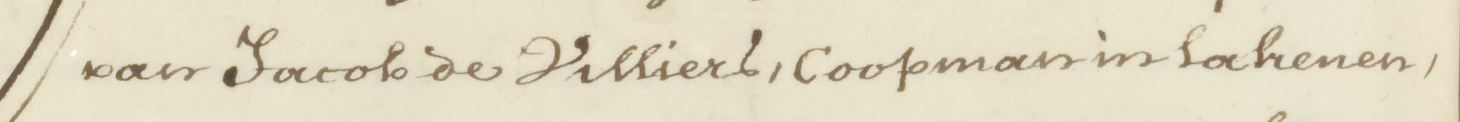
van Jacob de Villiers, Coopman in lakenen,
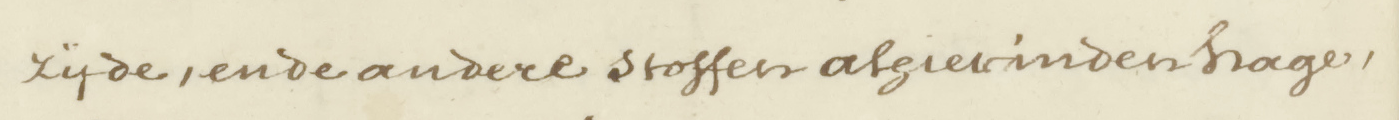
zijde, ende andere stoffen alhier inden Hage,
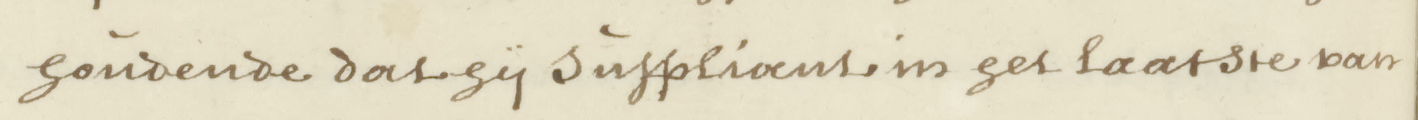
houdende dat hij suppliant in het laatste van
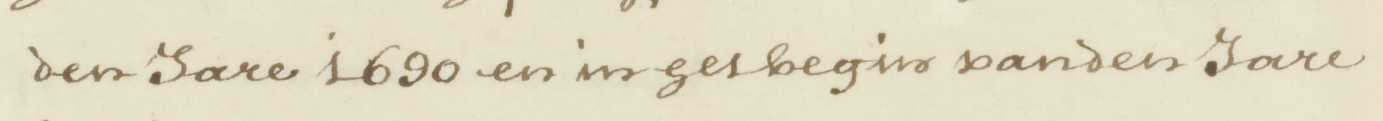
den jare 1690 en in het begin vanden Jare
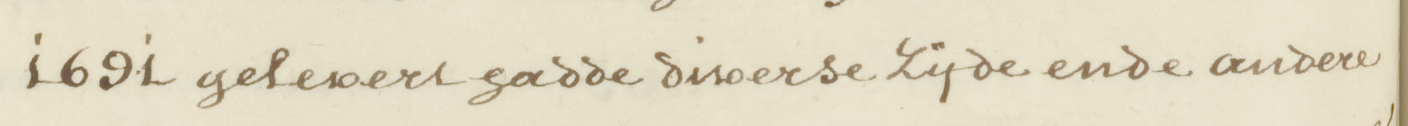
1691 gelevert hadde diverse zijde ende andere
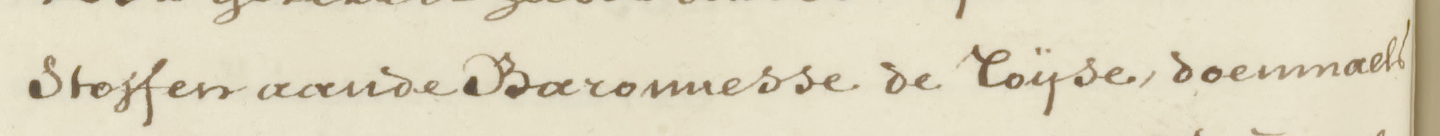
stoffen aande Baronnesse de Roijse, doenmaels
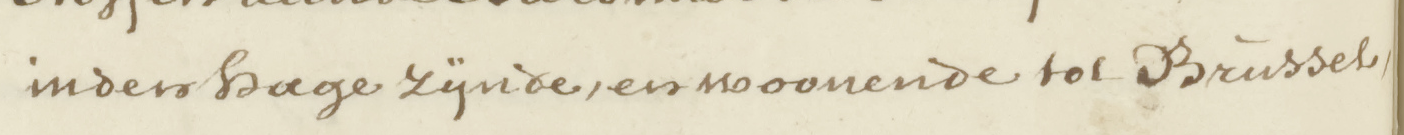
inden Hage zijnde, en woonende tot Brussel,
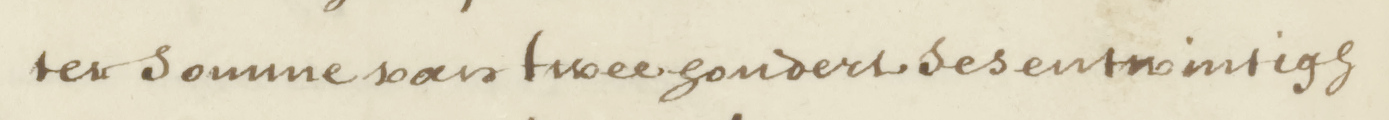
ter somme van twee hondert sesentwintigh
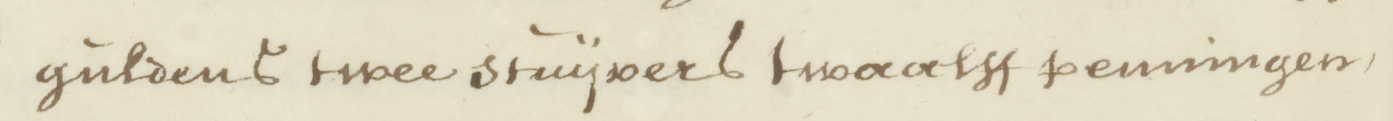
guldens twee stuijvers twaalff penningen
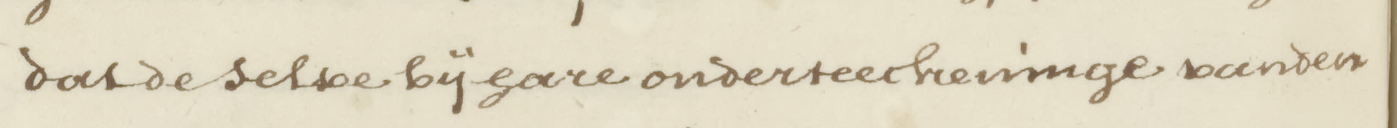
dat deselve bij hare onderteeckeninge vanden
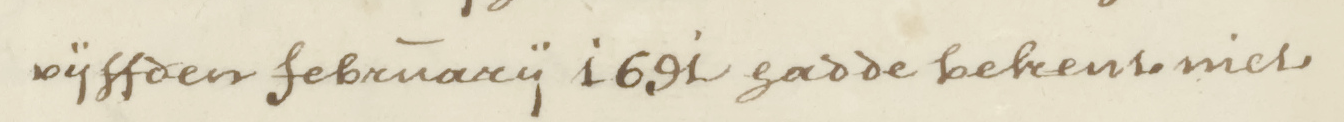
vijffden februarij 1691 hadde bekent niet
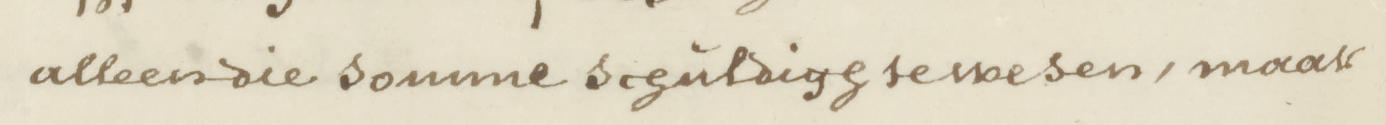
alleen die somme schuldigh te wesen, maar
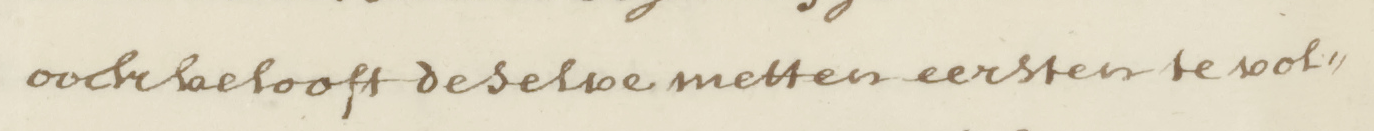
oock belooft deselve metten eersten te vol„
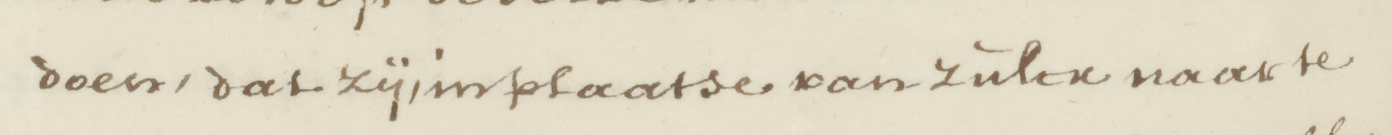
doen, dat zij in plaatse van zulcx naar te
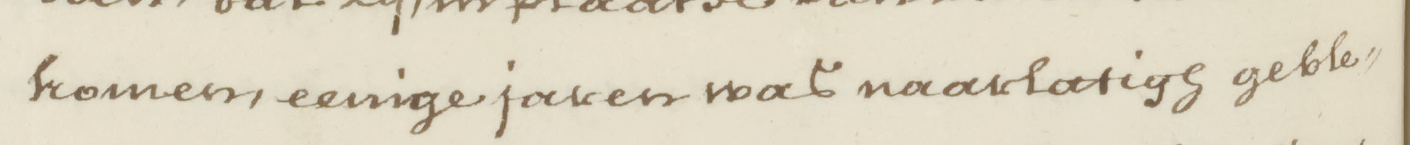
komen, eenige jaren was naarlatigh geble,,
